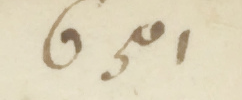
651
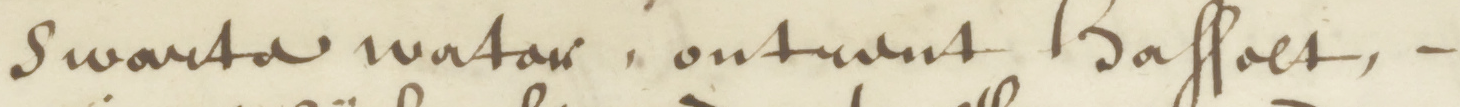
Swarte water, ontrent Hasselt,
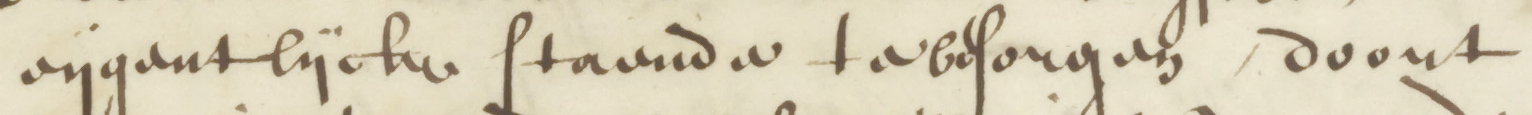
eijgentlijck staende te besorgen doort
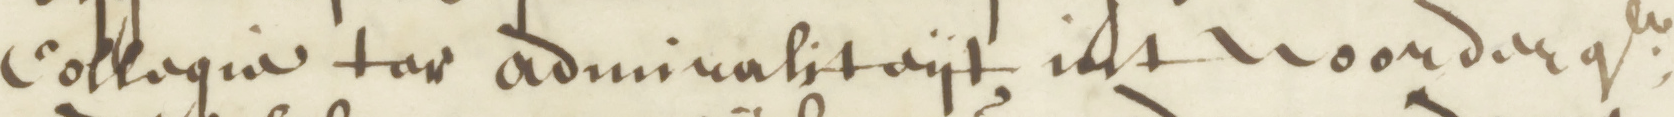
collegie ter admiraliteijt, int Noorderqr.
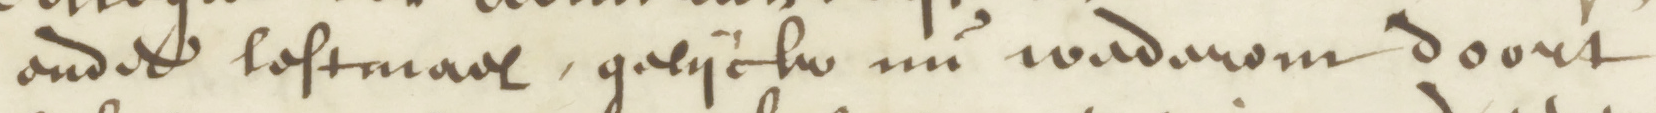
ende lestmael, gelijck nu wederom doort
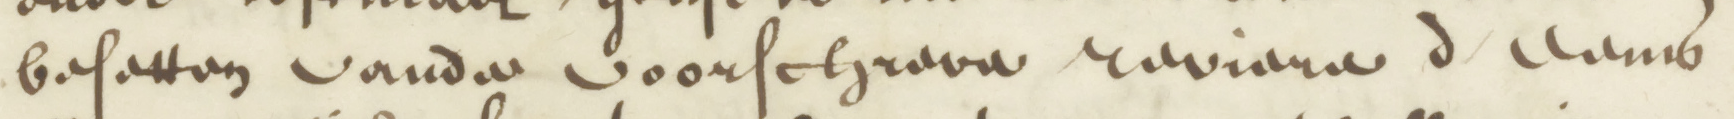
besetten vande voorschreve reviere d'Eems
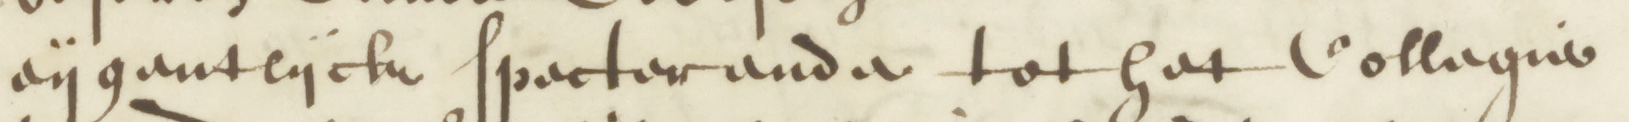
eigentlijck specterende tot het Collegie
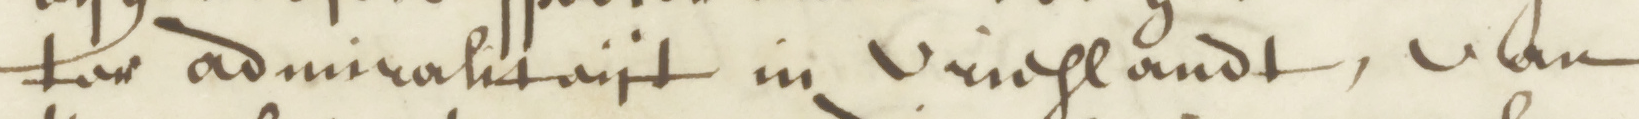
ter admiraliteijt in Vrieslandt, van
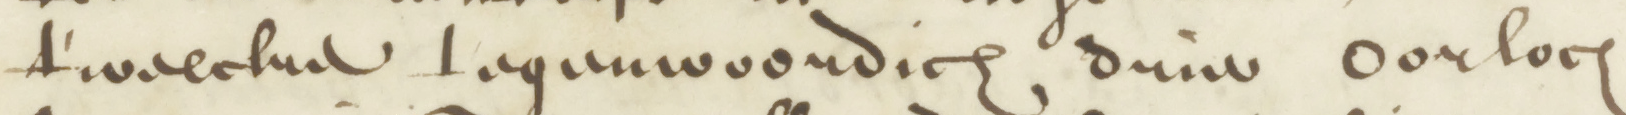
't welcke tegenwoordich drie oorloch
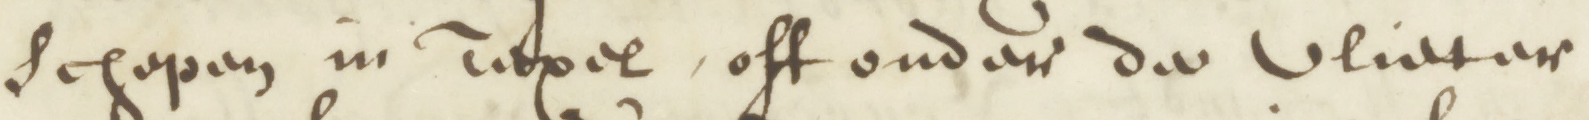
schepen in Texel, off onder de Vlieter
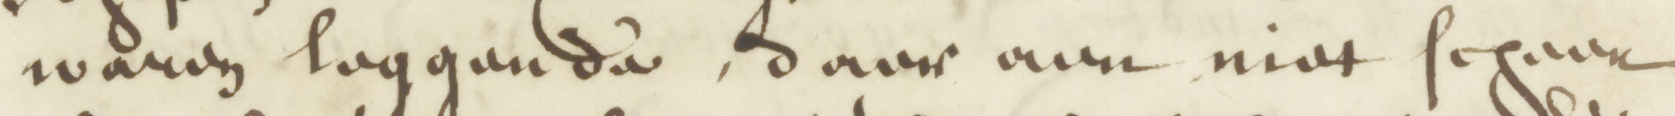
waren leggende, daer men niet scheen
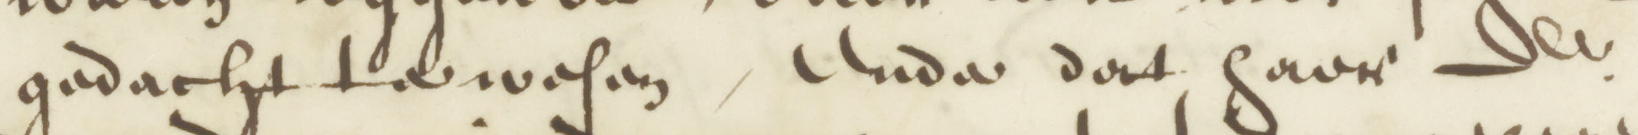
gedacht te wesen. Ende dat haer E.
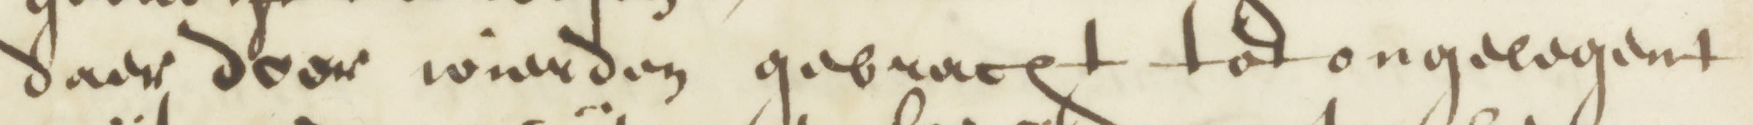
daer door wierden gebracht tot ongelegent„
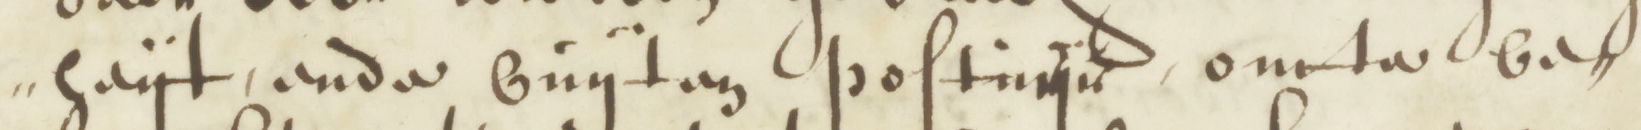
heijt, ende buijten postuijr, om te be„
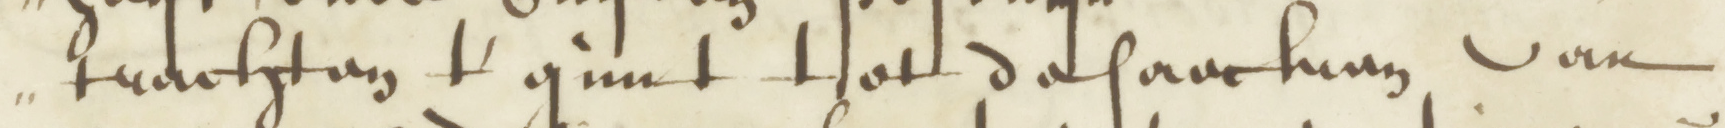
,,trachten t'gunt tot de saecken van
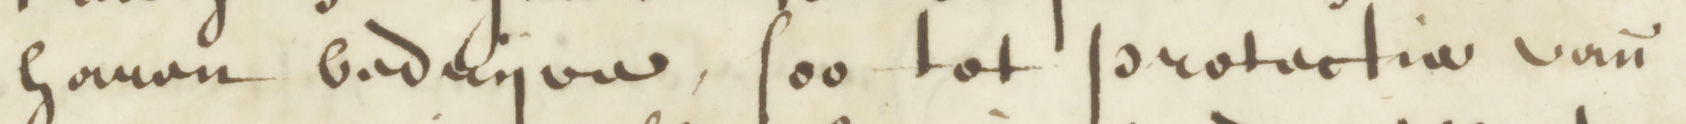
haren bedrijve, soo tot protectie van
